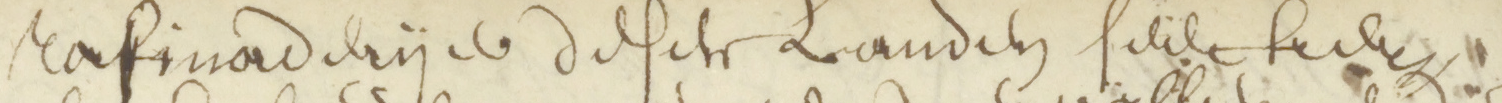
rafinaderije deser Landen seecker,,
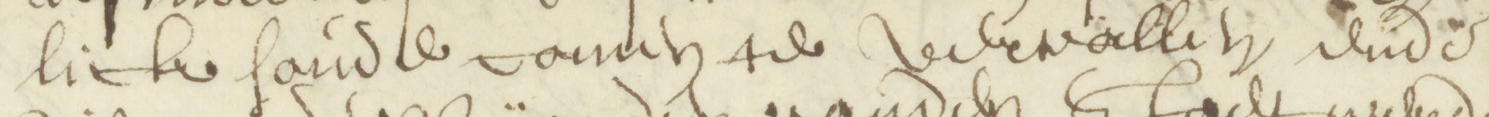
lick soude comen te vervallen, ende
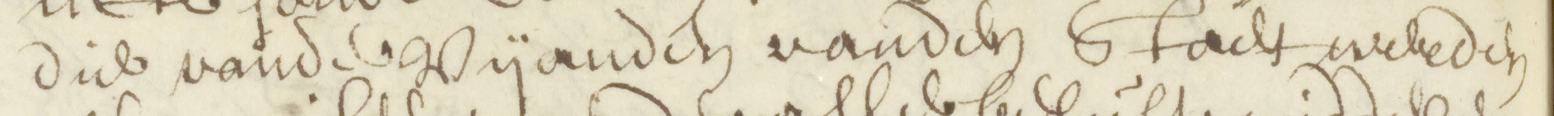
die vande Vijanden vanden Staet werden
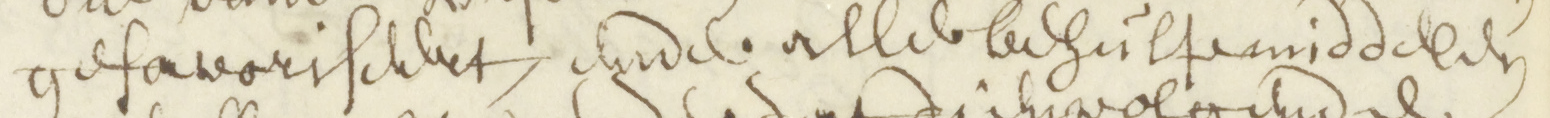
gefavoriseert, ende alle behulpmiddelen
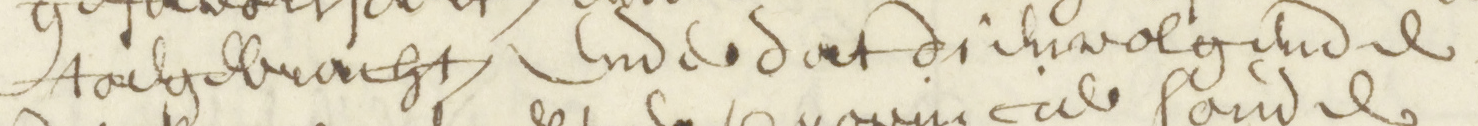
toegebracht, ende dat dienvolgende
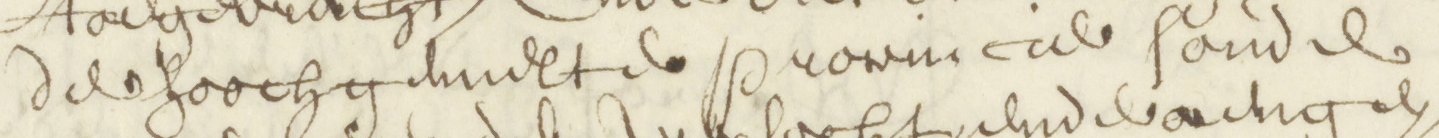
de hoochgemelte provincie soude
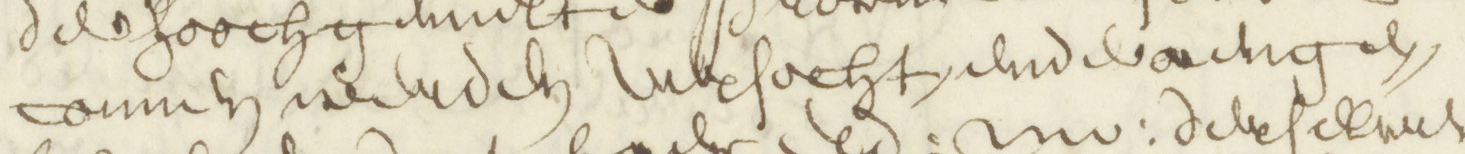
connen werden versocht, ende aenge„
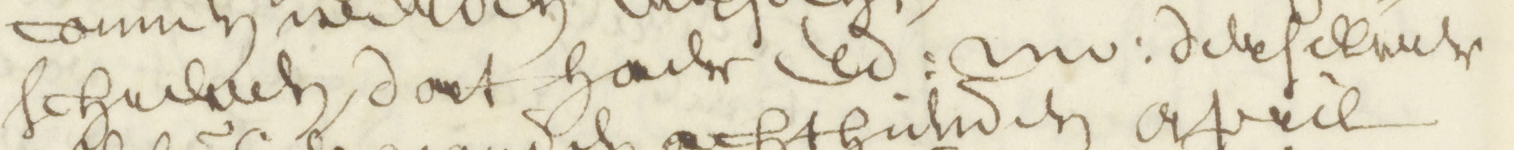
schreven, dat haer Ed:Mo: derselver
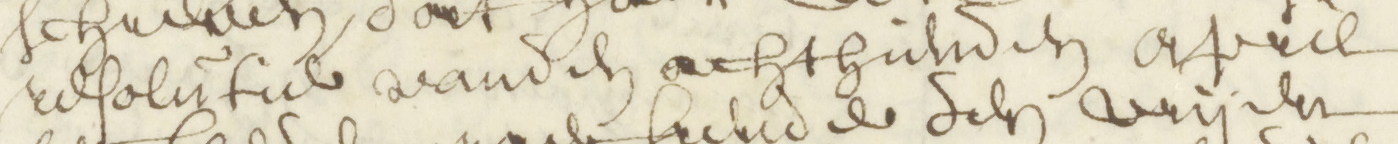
resolutie vanden achthienden april
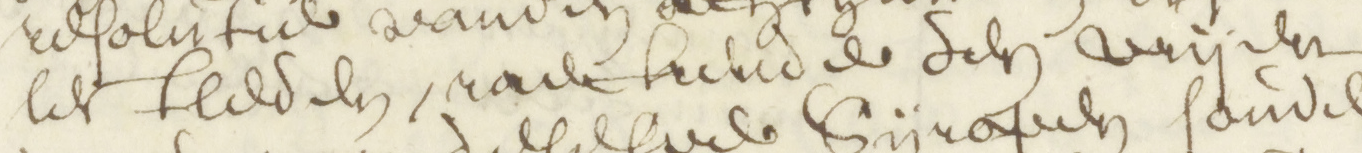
lestleden, raeckende den vrijen
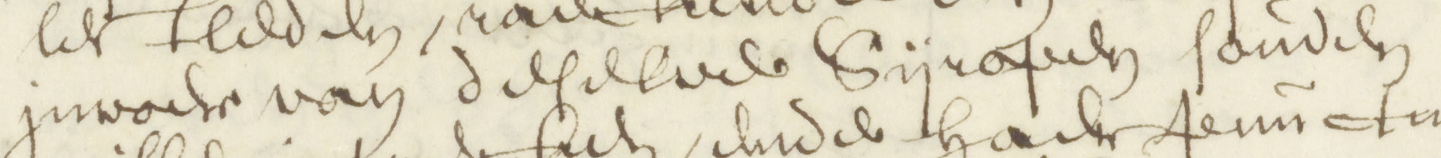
invoer van deselve Sijropen souden
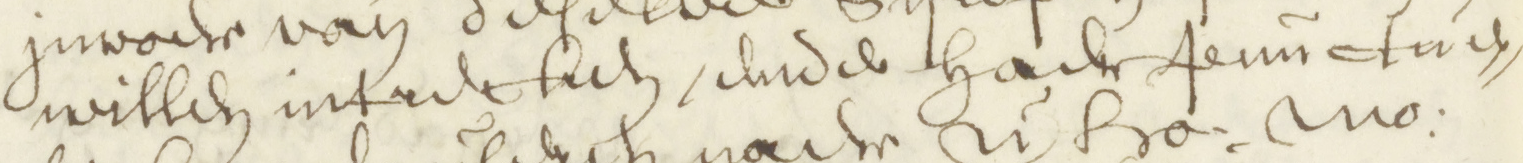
willen intrecken, ende haer punctue,
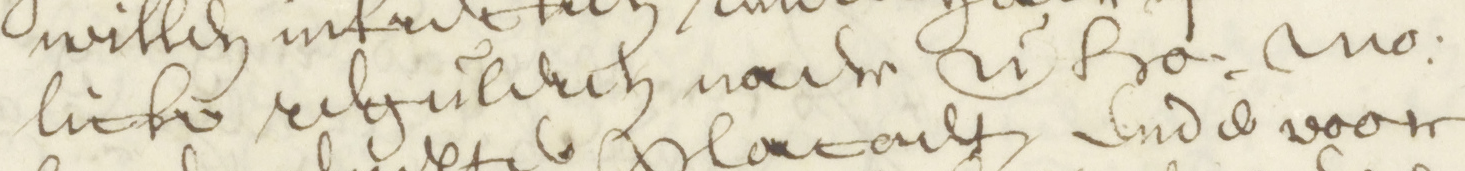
lick reguleren naer U Ho:Mo:
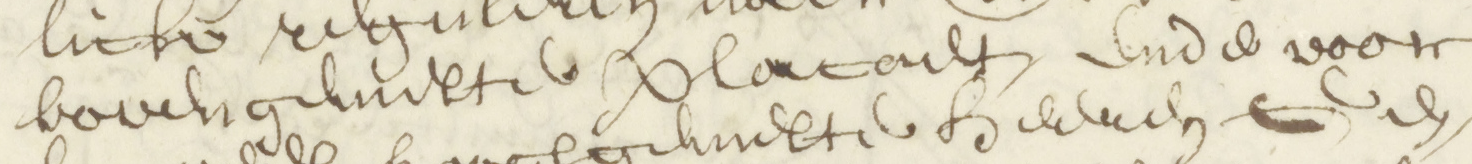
bovengemelte placaet, ende voor
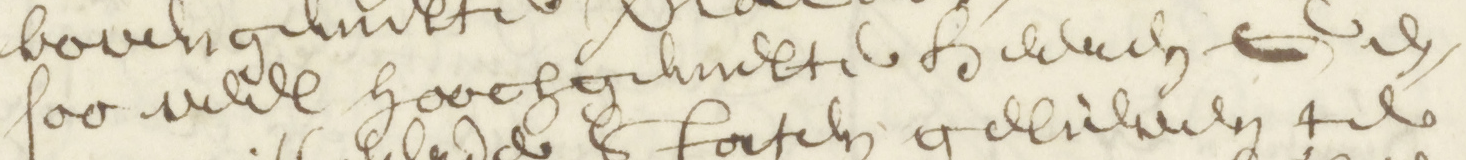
soo veel hoochgemelte Heeren Ge,,
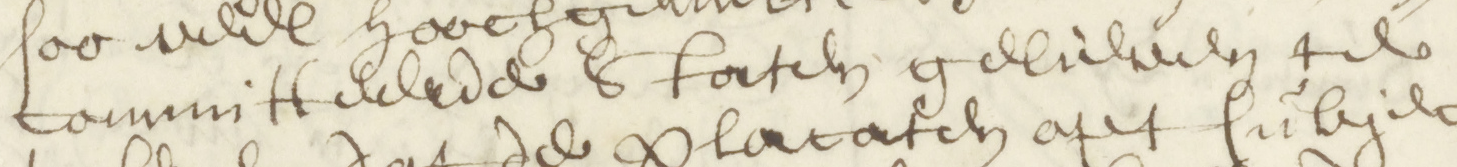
committeerde Staten gelieven te
